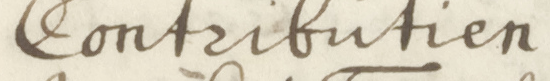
Contributien
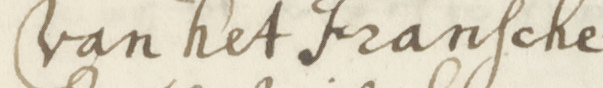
van het Fransche
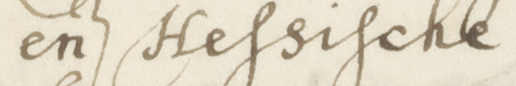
en Hessische
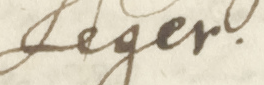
Leger.
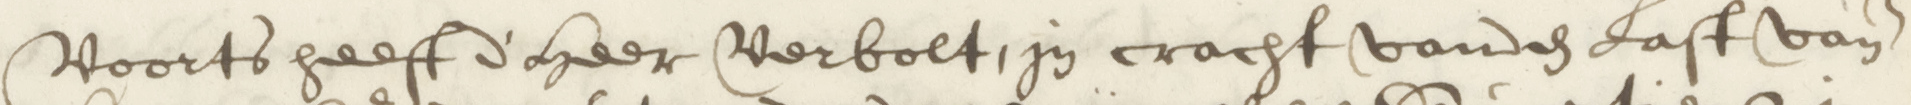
Voorts heeft d'heer Verbolt, in cracht vanden Last van
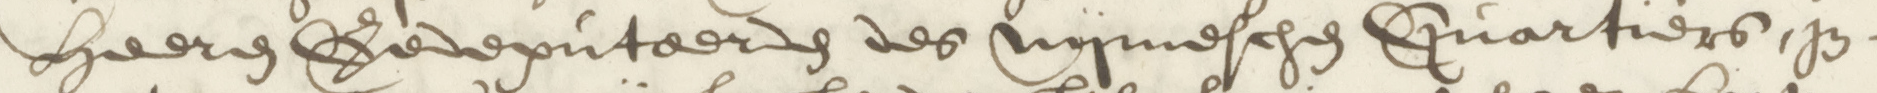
Heeren Gedeputeerden des Nijmeschen Quartiers, in
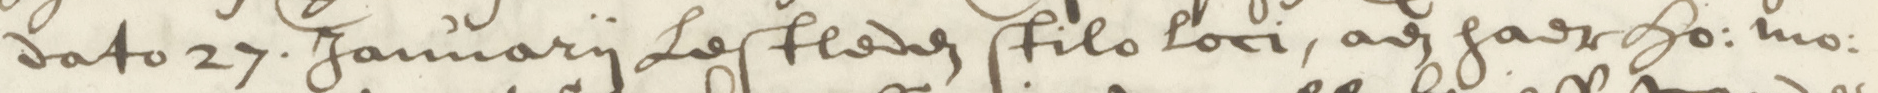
dato 27. Januarij lestleden stilo loci, aen haer Ho:Mo:
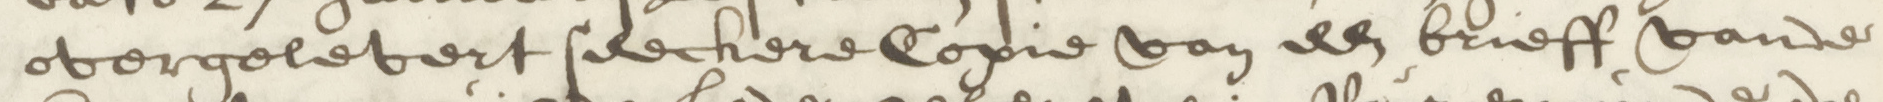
overgelevert seeckere Copie van een brieff vande
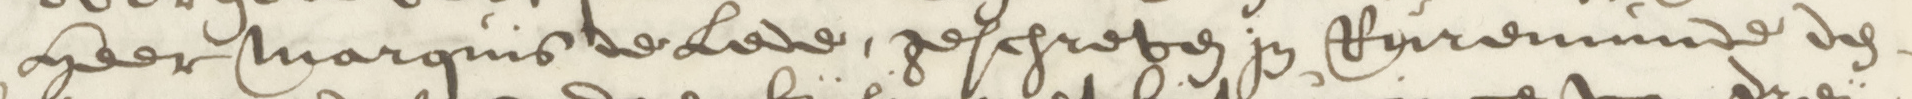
heer Marquis de Lede, geschreven in Ruremunde den -
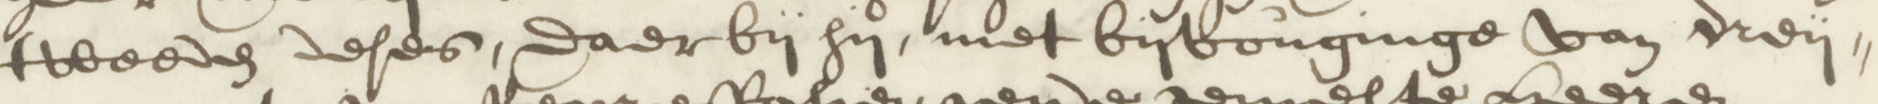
tweeden deses, Daer bij hij, met bijvouginge van dreij„
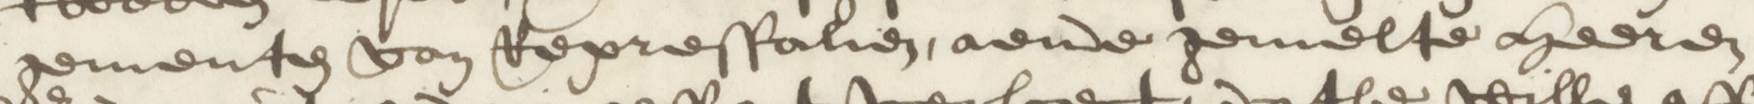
gementen van Repressalien, aende gemelte heeren —
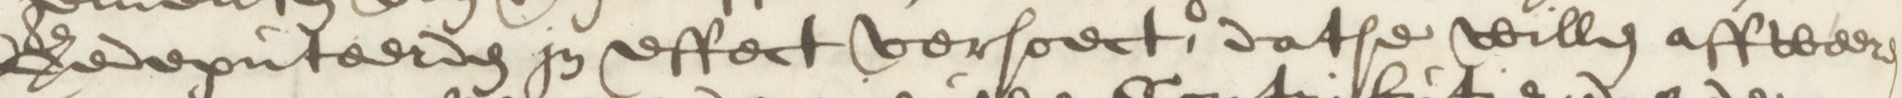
Gedeputeerden in effect versoect, datse willen affweeren
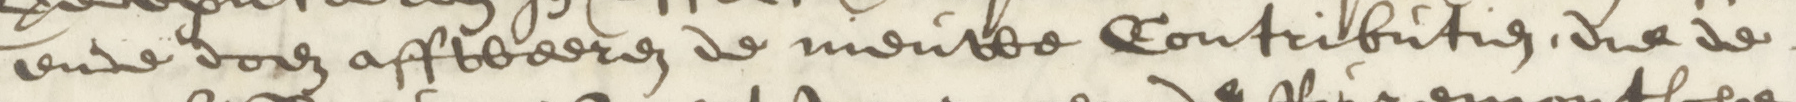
ende doen affweeren de nieuwe Contributien, die de
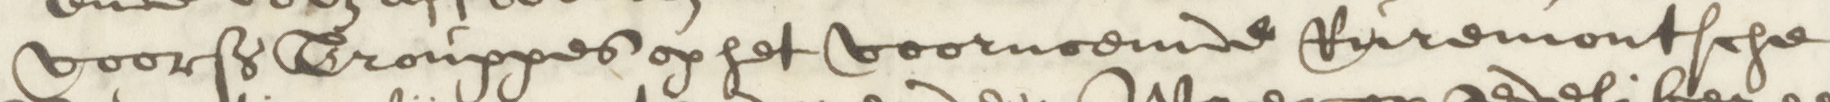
voors Trouppes op het voornoemde Ruremontsche
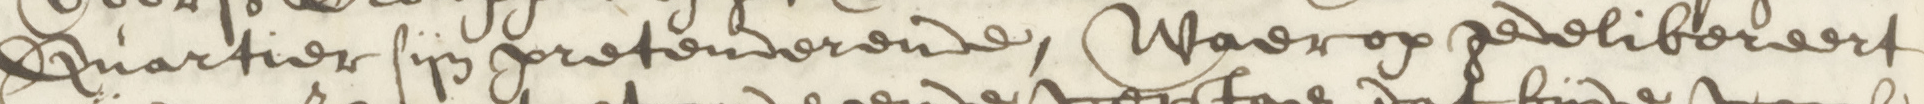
Quartier sijn pretenderende. Waerop gedelibereert
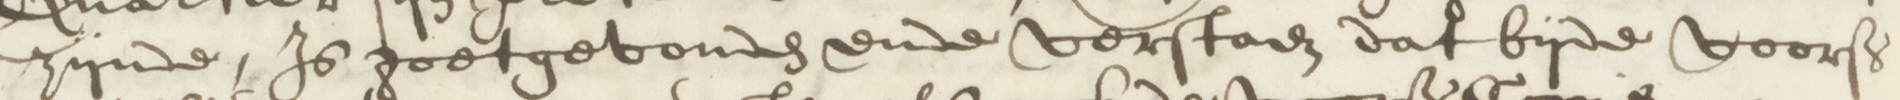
zijnde, Is goetgevonden ende verstaen dat bijde voors
